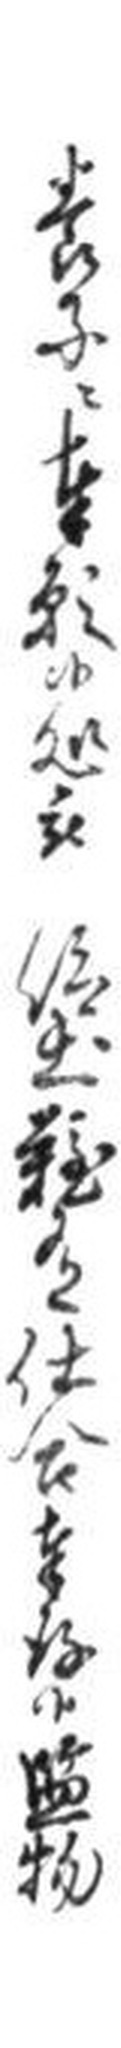養子ニ奉願候処被仰出難有仕合奉存候監物
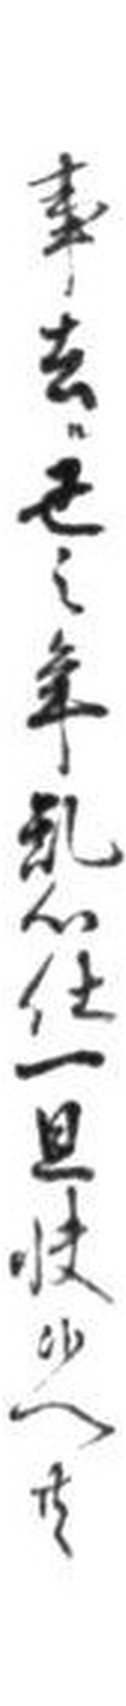事去ル丑之年乱心仕一旦快候ヘ共
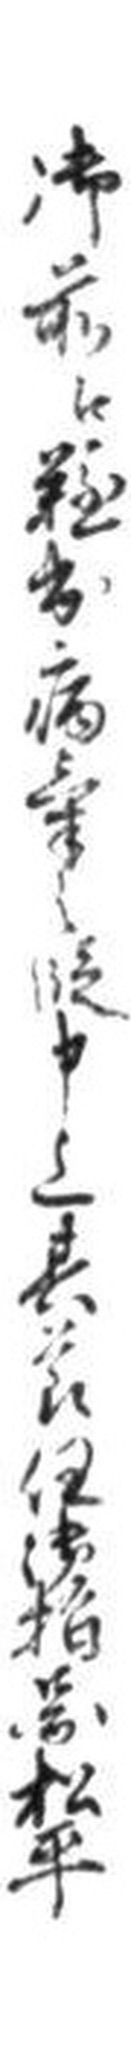御前江難出病気之段申上其節任御指図松平
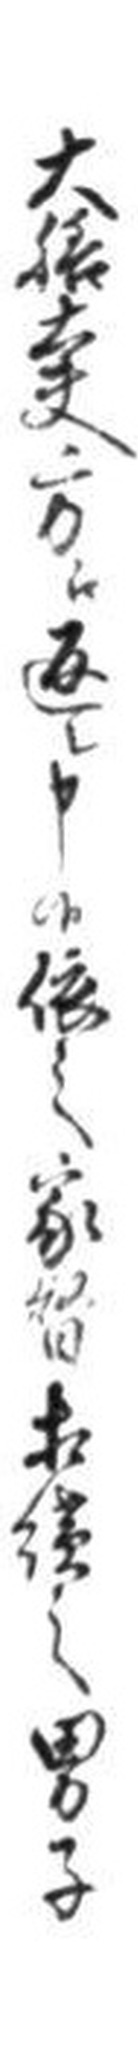大膳太夫方江返シ申候依之家督相続之男子
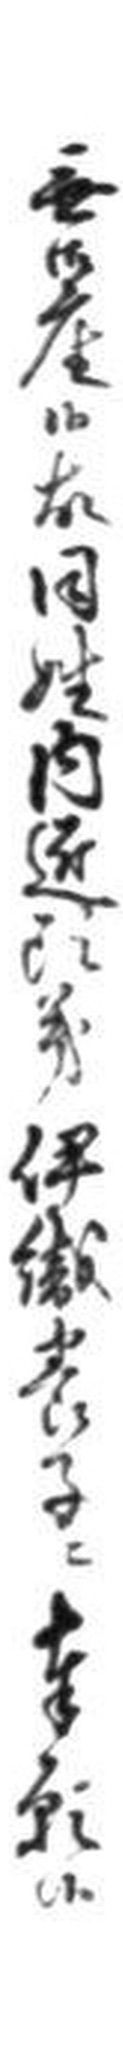無御座候故同姓内匠頭弟伊織養子ニ奉願被
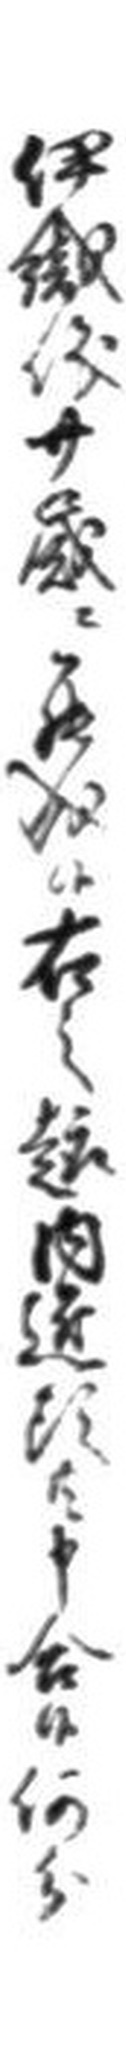伊織儀廿歳ニ罷成候右之趣内匠頭共申合候何分
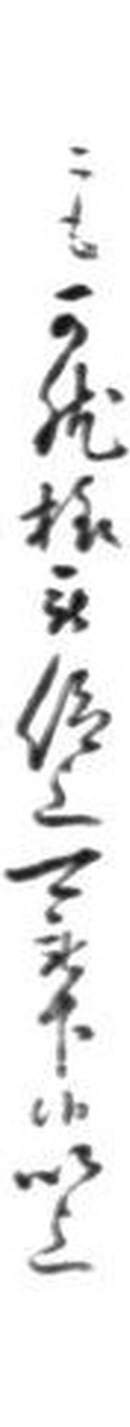二も可然様被仰上可被下候以上
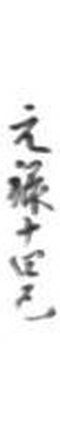元禄十四巳
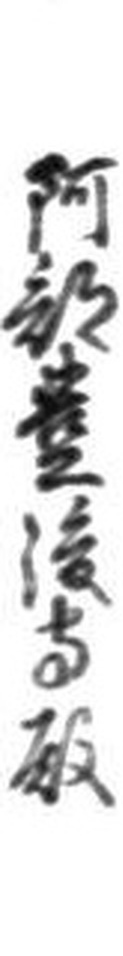阿部豊後守殿
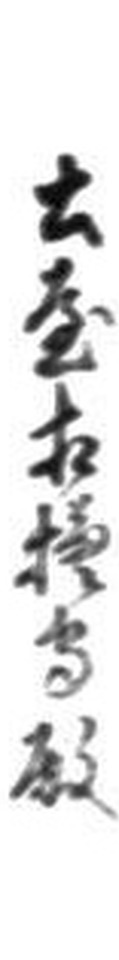土屋相模守殿
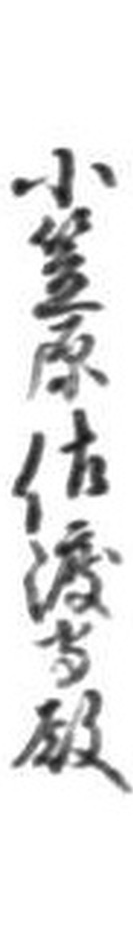小笠原佐渡守殿
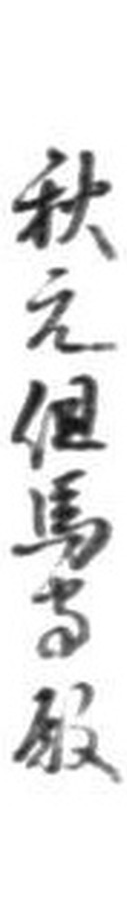秋元但馬守殿
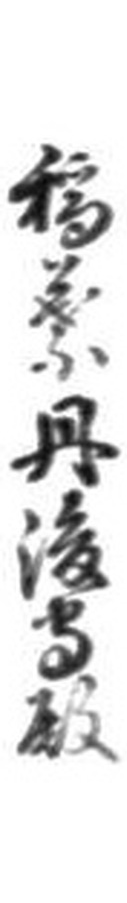稲葉丹後守殿

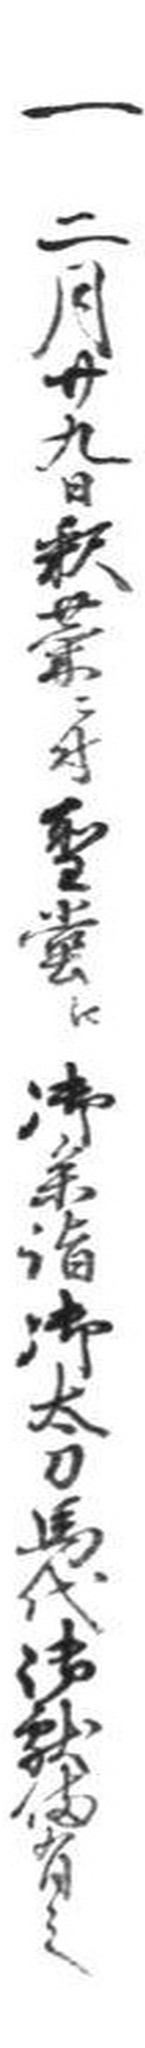一二月廿九日釈菜ニ付聖堂江御参詣小太刀馬代御献備有之
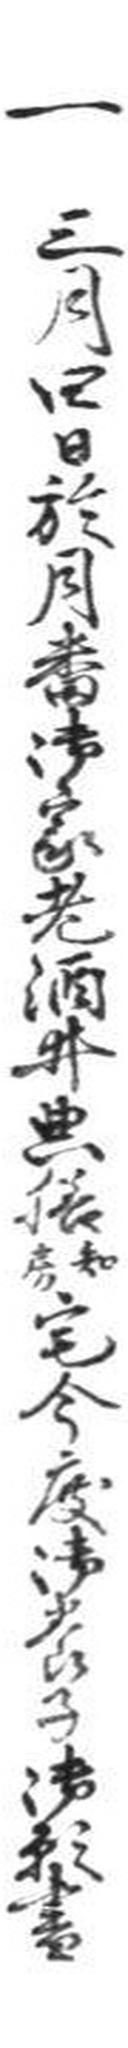一三月四日於月番御家老酒井典膳知房宅今度御養子御願書
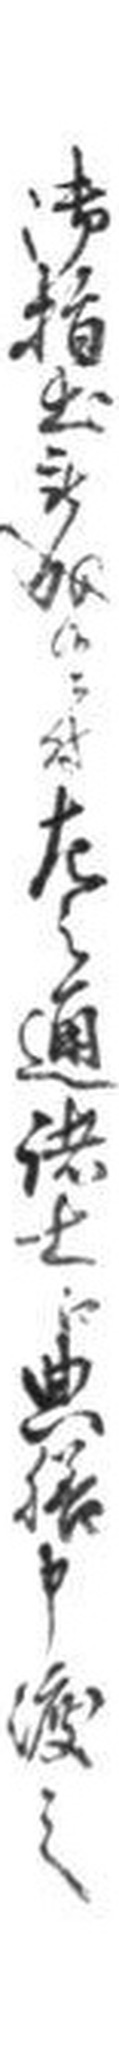御指出被成候ニ付左之通諸士江典膳申渡之
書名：家譜 二十一 吉品公 従元禄十三年到同十四年
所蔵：福井県文書館 Fukui Prefectural Archives
